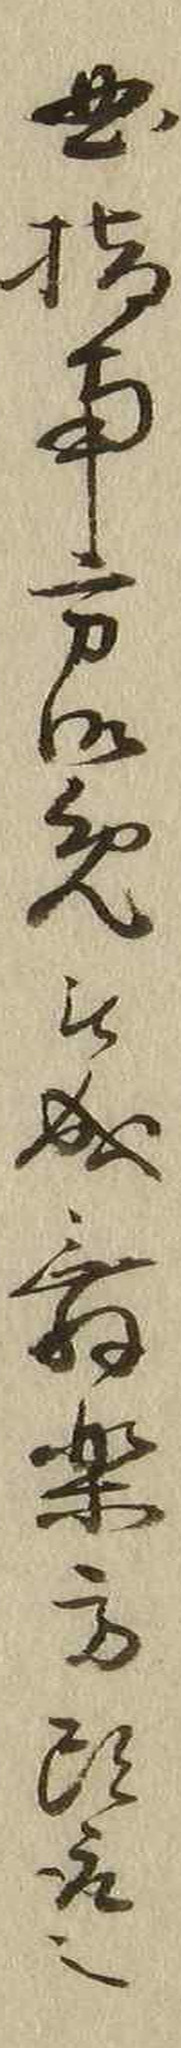曲指南方御免被成舞楽方頭取之
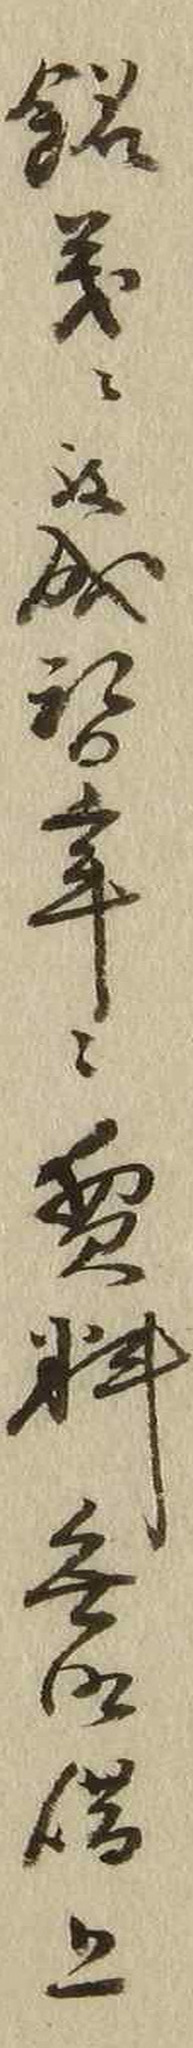銘義ニ被成替年々費料無御借上
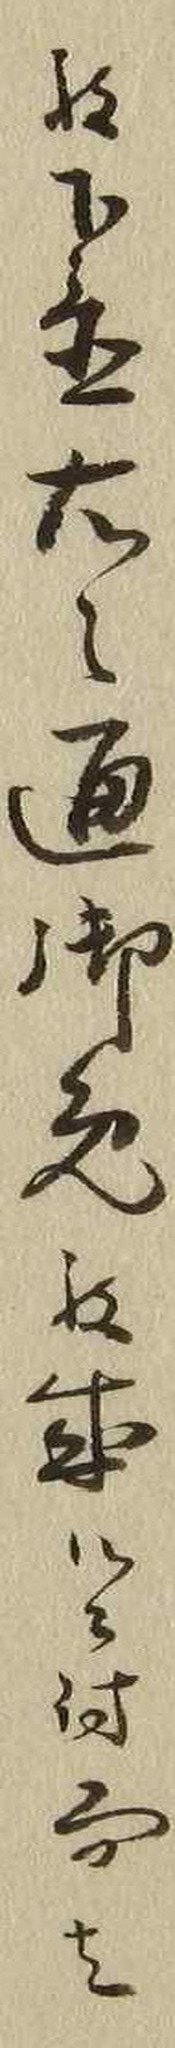被下置右之通御免被成候ニ付而者
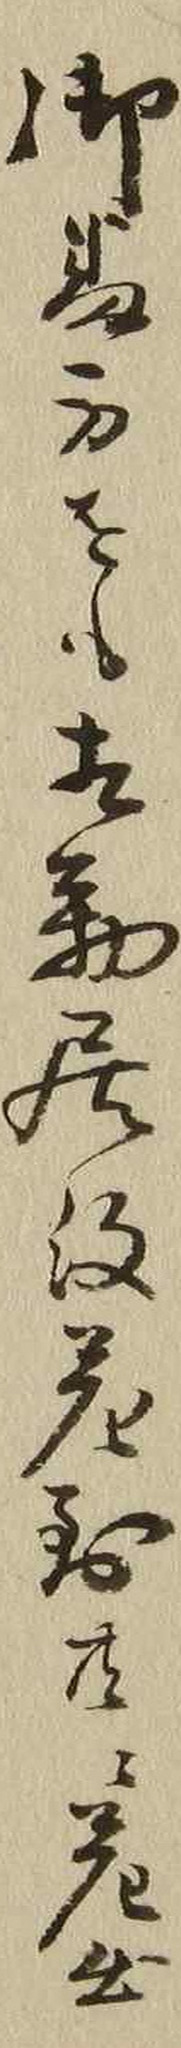御番方をも相勤居役差到共ニ差出
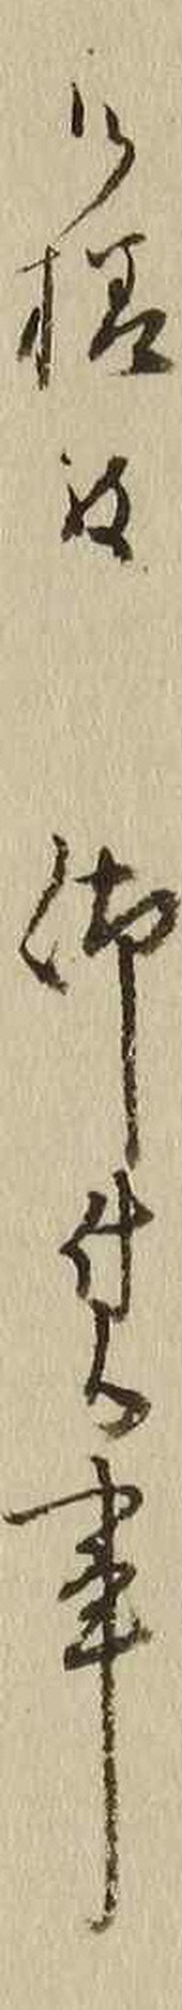候様被仰付候事
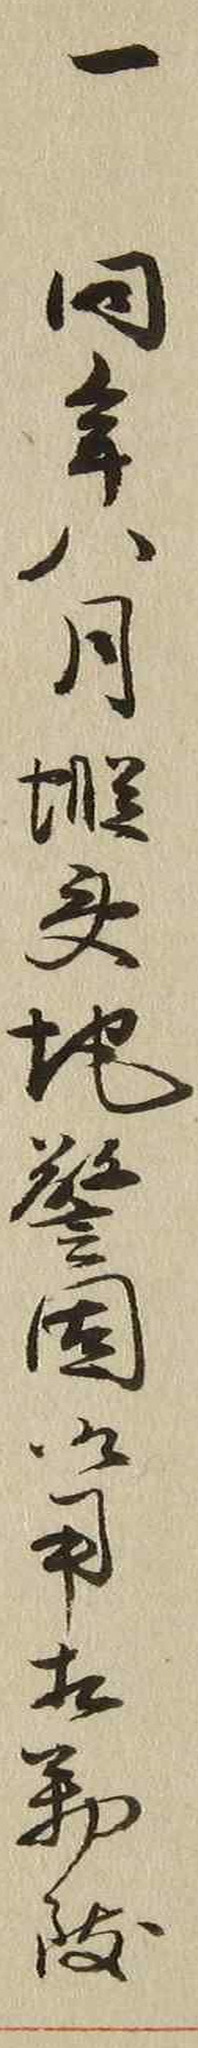一同年八月蝦夷地警固御用相勤致
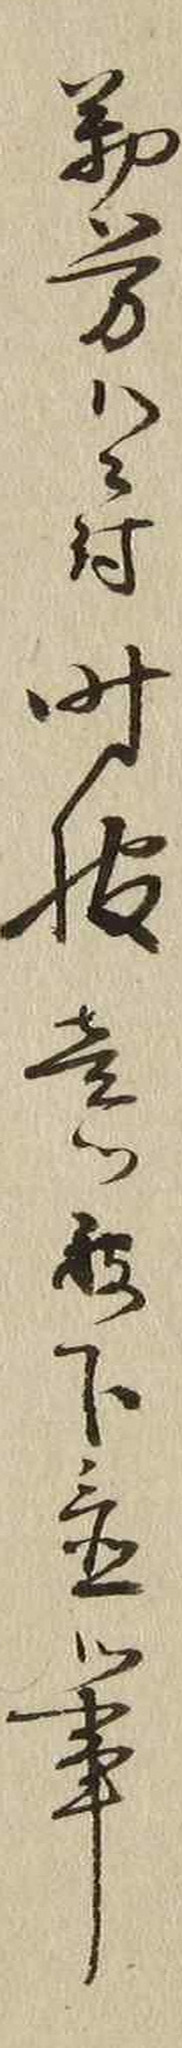勤労候ニ付時服壱ツ被下置候事
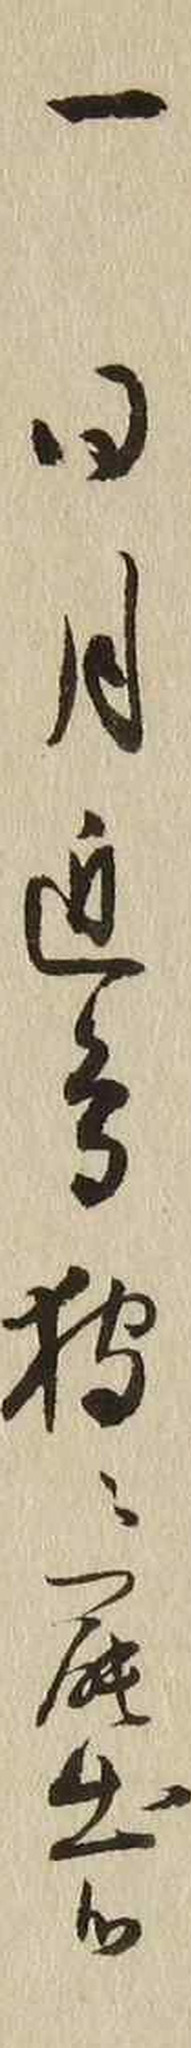一同月追鳥狩ニ罷出候
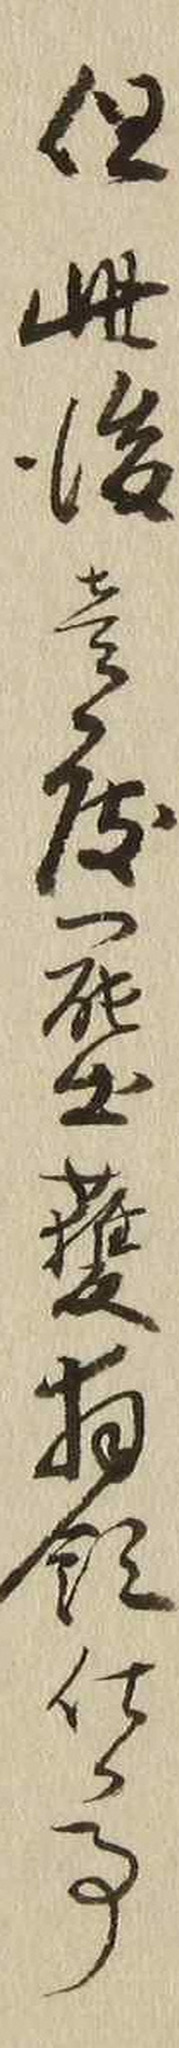但此後壱度罷出獲拝領仕候事
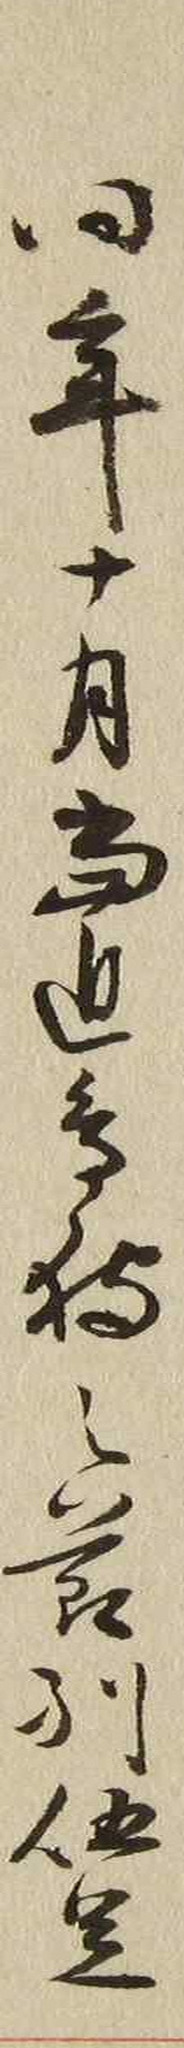一同年十月当追鳥狩之節列伍足
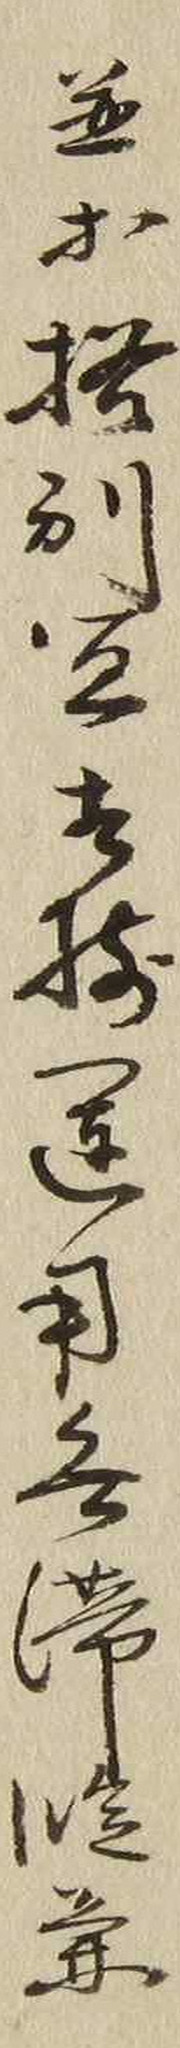並等格別宜相揃運用無滞段兼
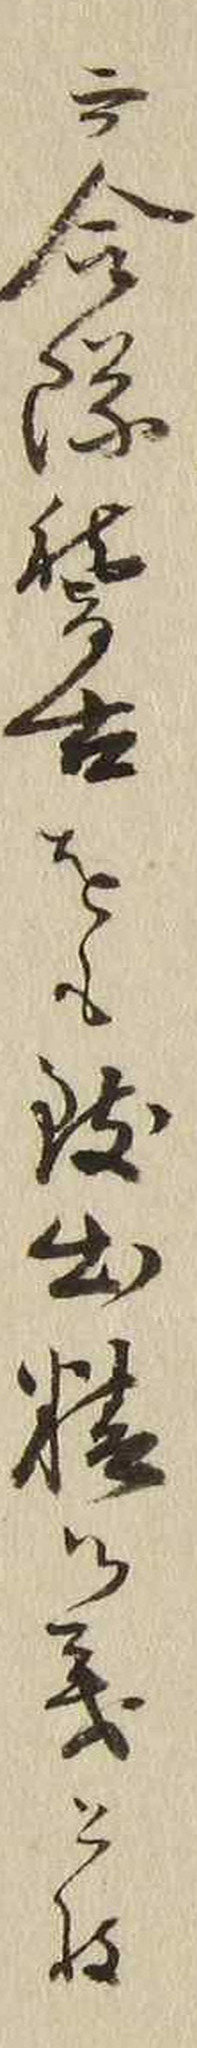而合隊稽古をも致出精候義ニ被
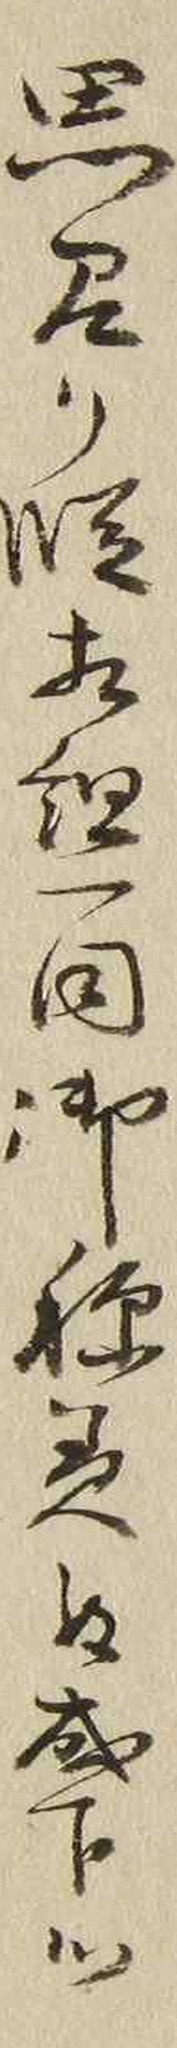思召候段相組一同御称美被成下候
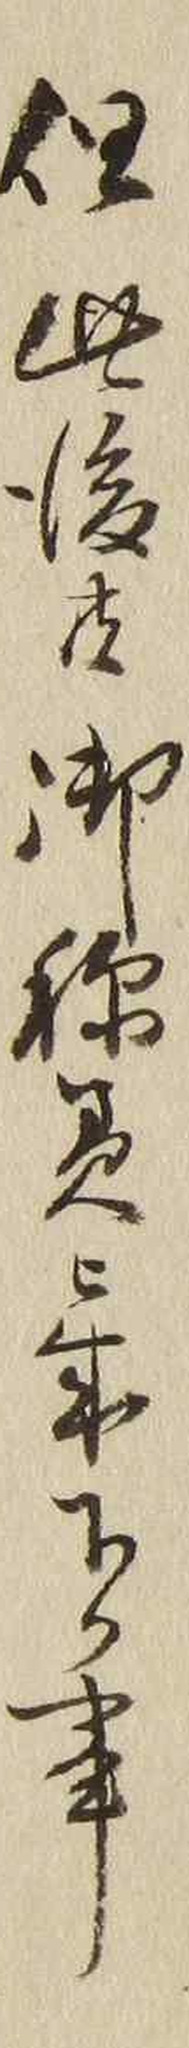但此後共御称美被成下候こと
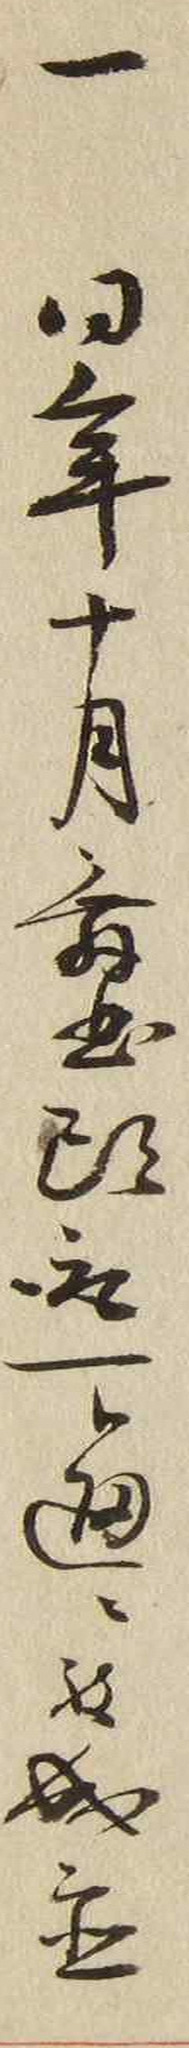一同年十月舞曲頭取一ト通ニ被成置

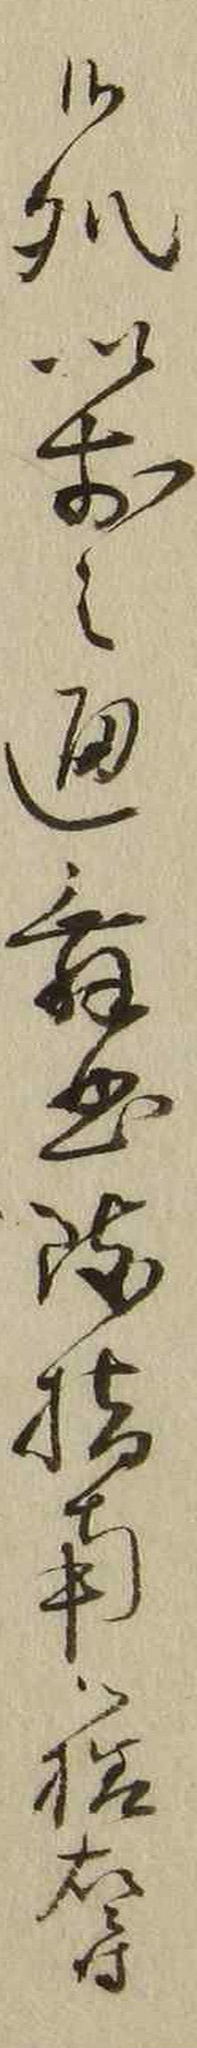候処以前之通舞曲致指南候様右ニ付
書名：諸士系譜　巻之221　ま之部2
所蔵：会津若松市立会津図書館
